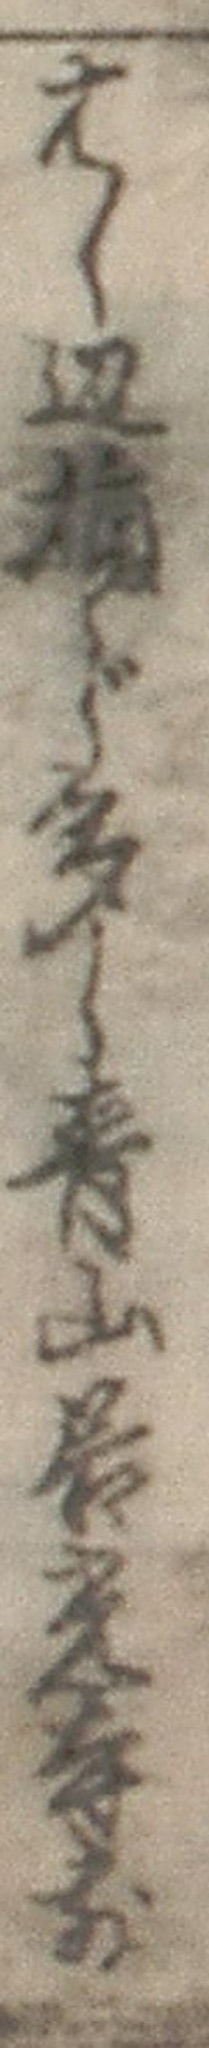はし辺損じ多し青山善光寺前
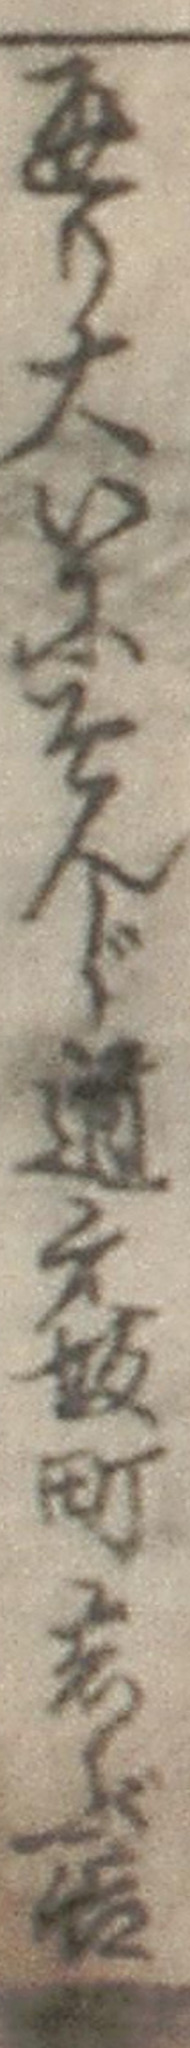通り大いにそんじ道玄坂町しぶ谷
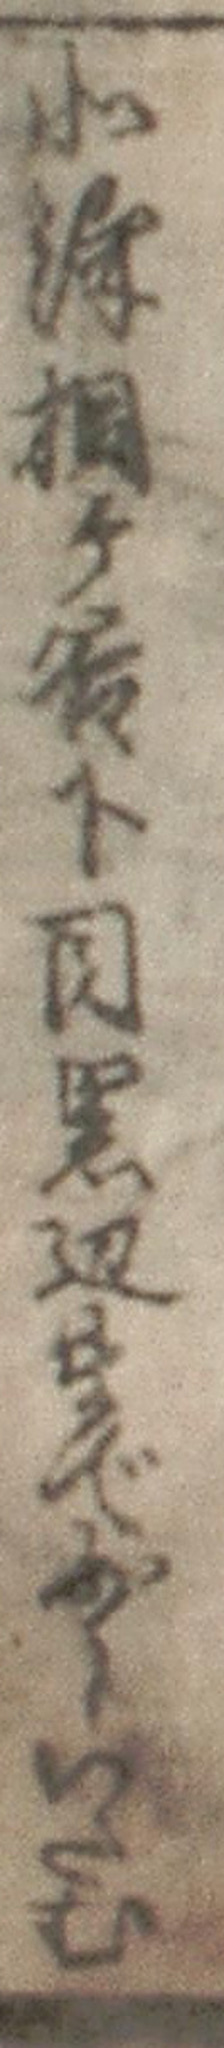北沢桐ヶ谷下目黒辺まで少しいたむ

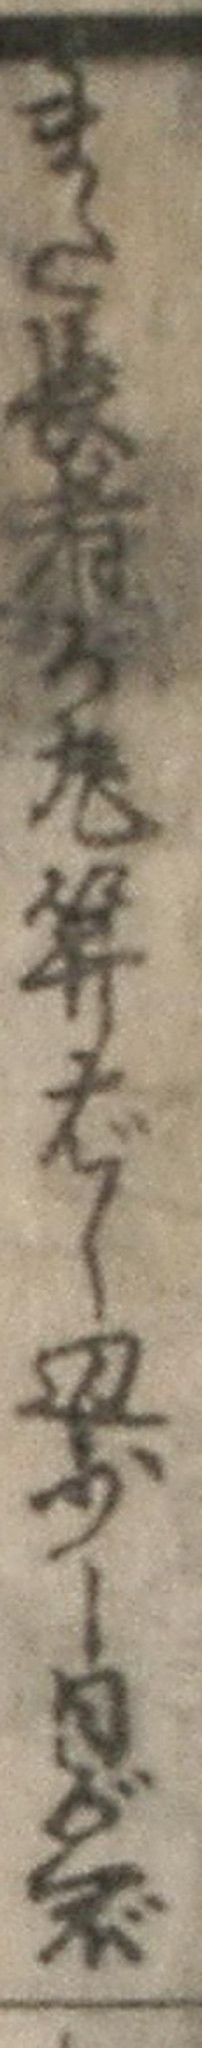また長者が丸笄橋辺少し日が？ぼ
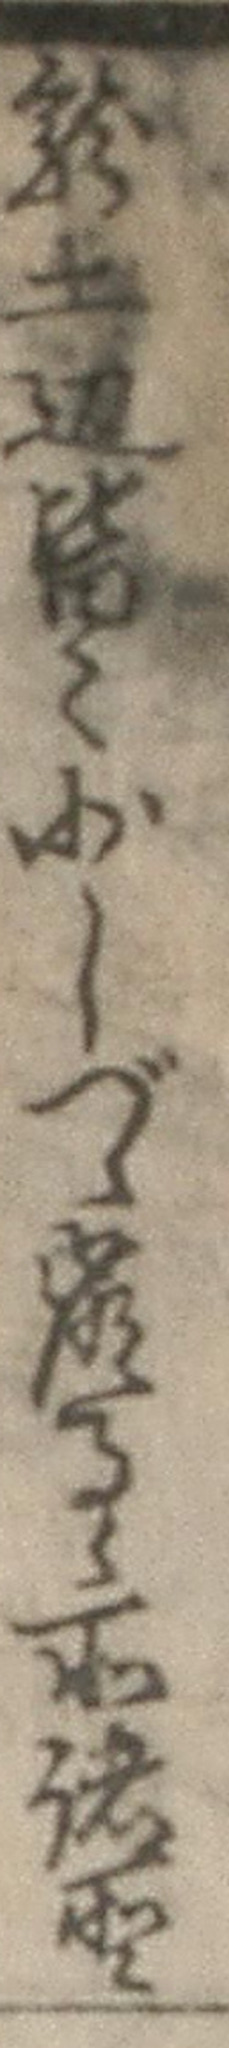籠？土辺皆〻少しづゝ崩るゝ所諸所〻
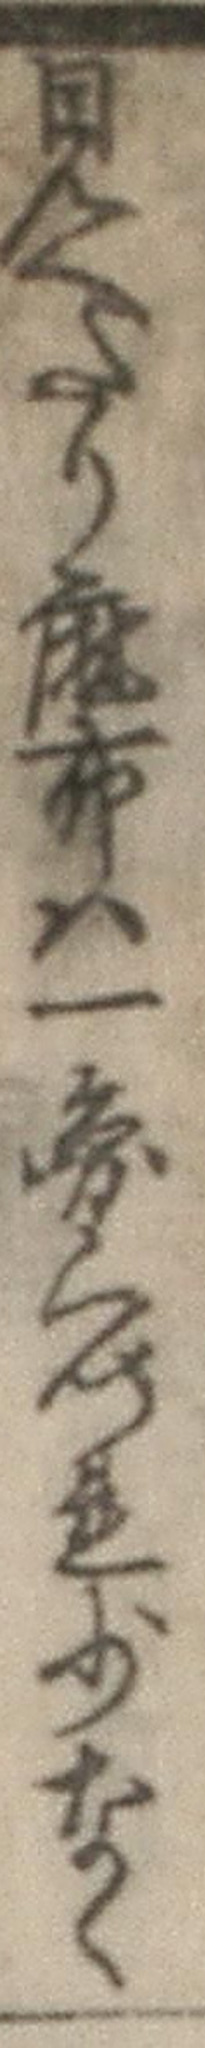見へたり麻布は一円くづれ少なく
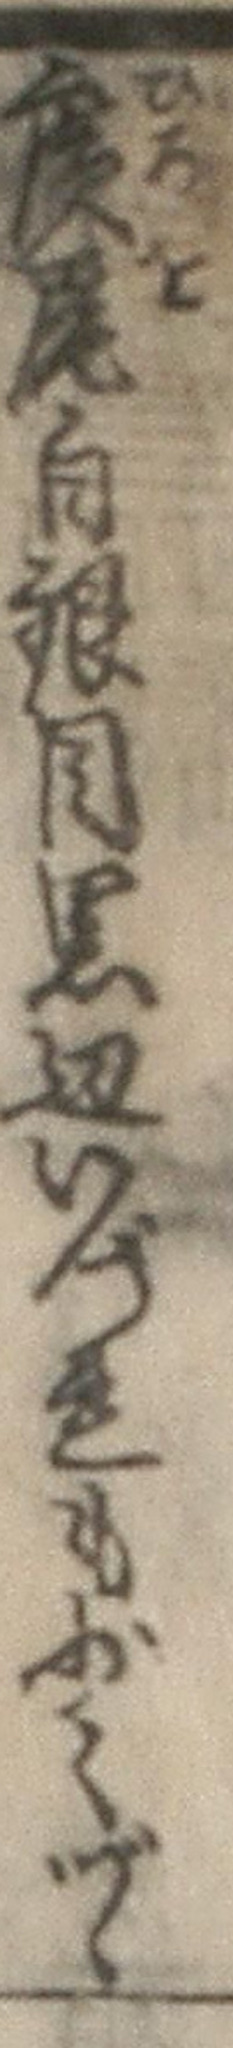廣尾白銀目黒辺いづれも少〻づゝ
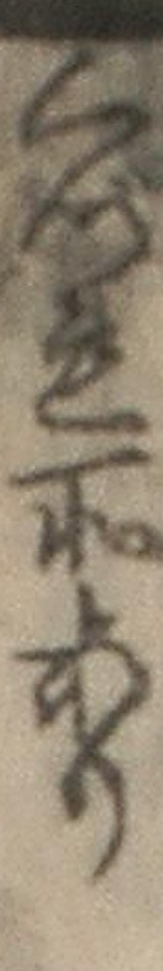くづれ所あり
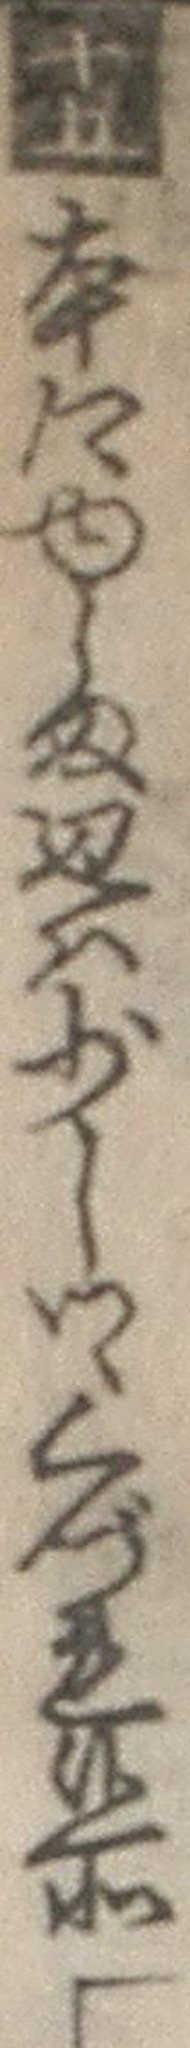十五本郷ゆしま辺は少しつゝくづれ候所
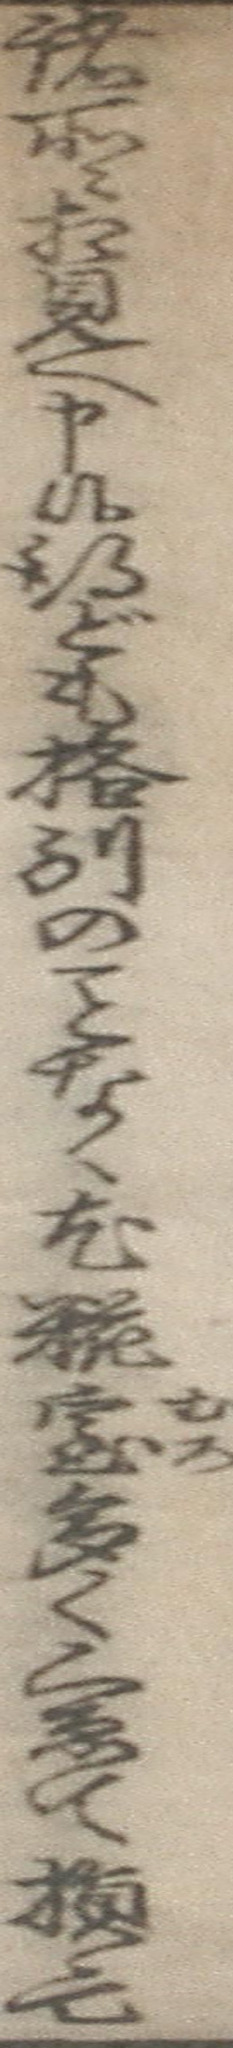諸所〻相見へ申候得ども格別のことなく尤麹室多くくゑて損亡
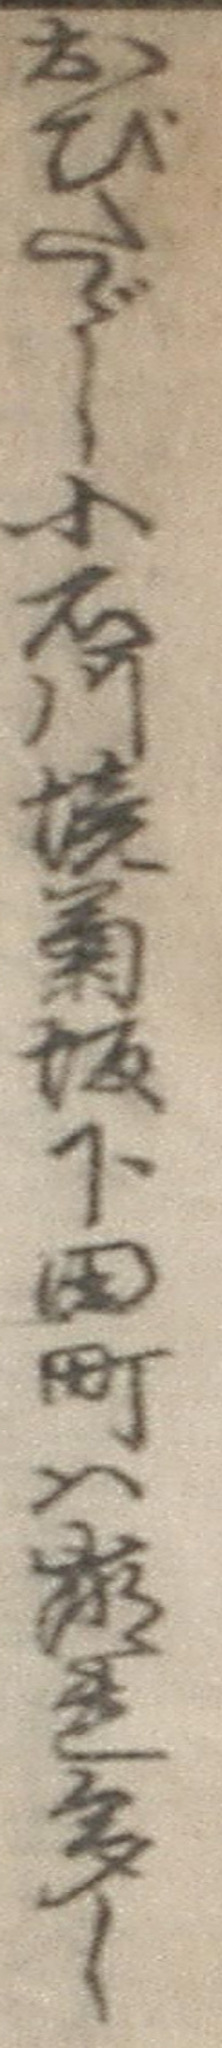おびたゞし小石川境菊坂下田町は崩れ多し
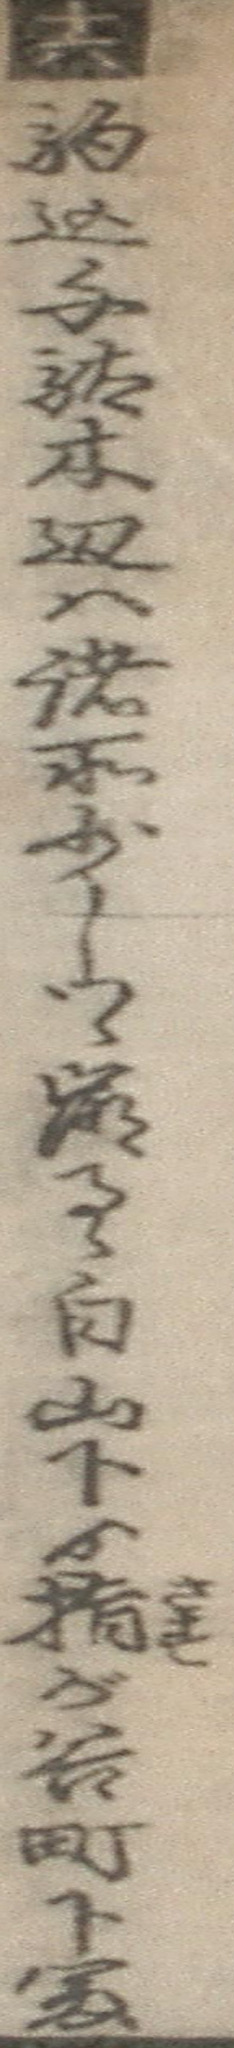十六駒込千駄木辺は諸所少しつゝ崩るゝ白山下ゟ指が谷町下富
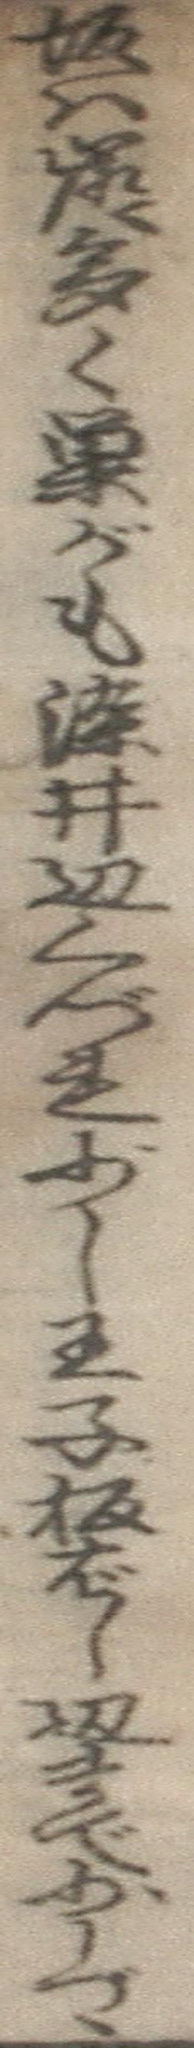坂は崩多く巣がも染井辺くづれ少し王子板ばし辺まで少しづゝ
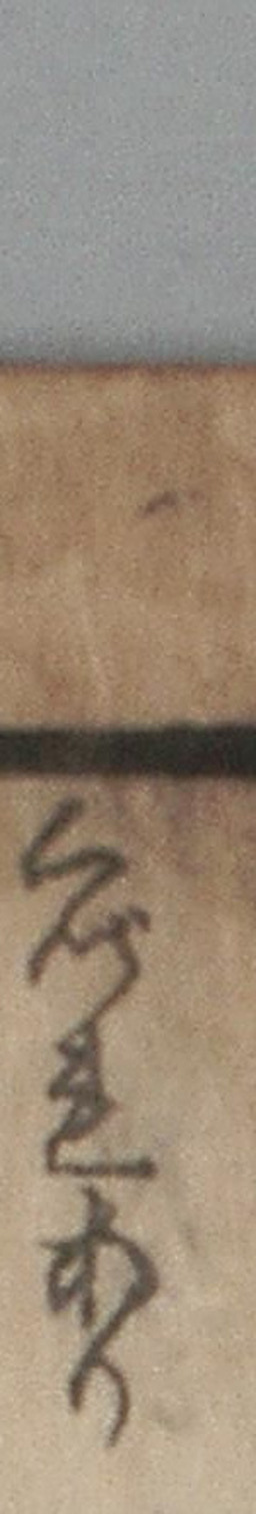くづれあり
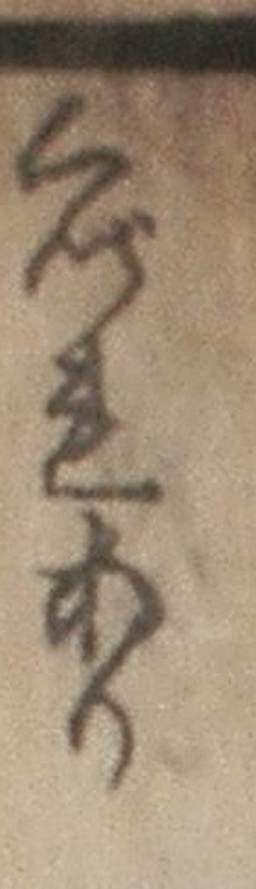くづれあり
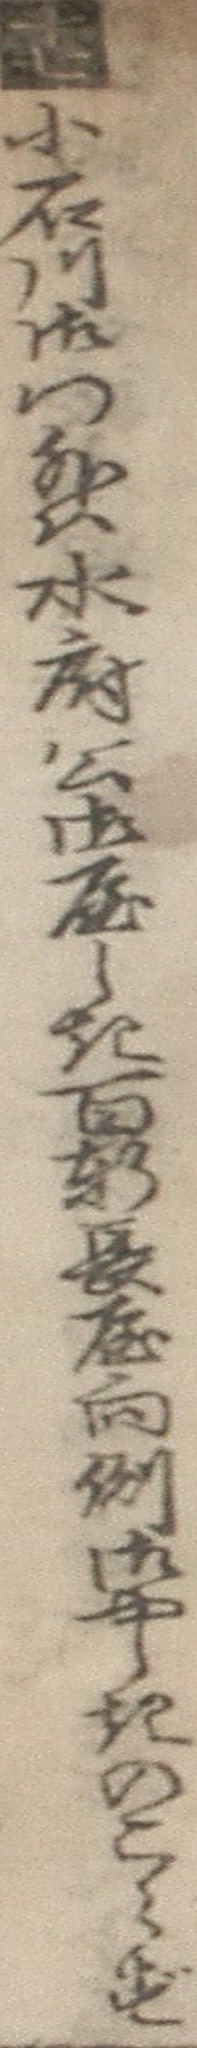十七小石川御門外は水府公御屋しき百軒長家向側御やしきのこらず
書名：江戸大地震末代鑑
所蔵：東京大学地震研究所図書室 Earthquake Research Institute Library, The University of Tokyo, JAPAN
